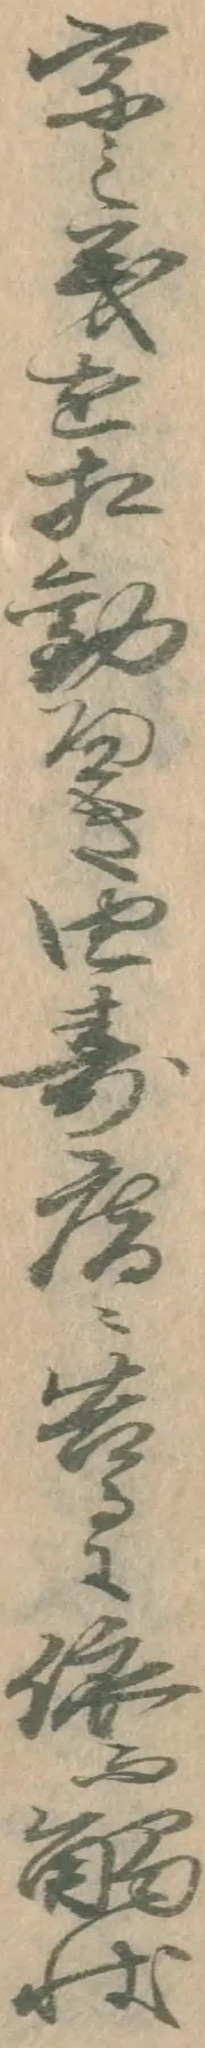宗之義を相勧へき由寿庵に告るに依而触状
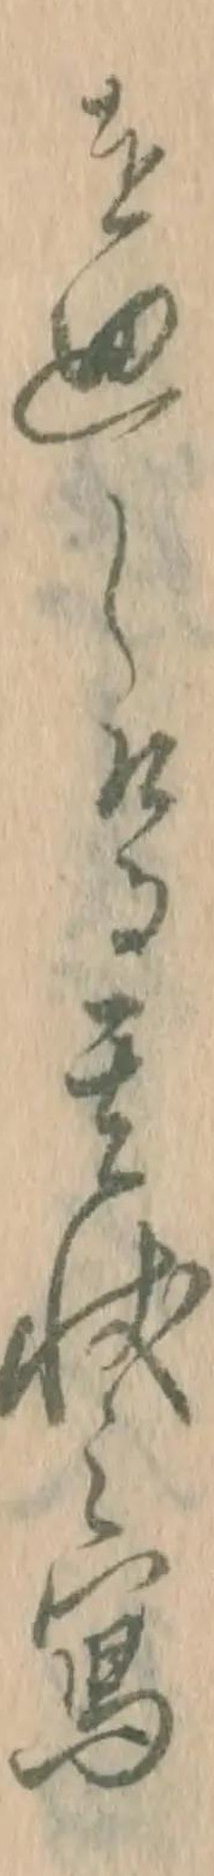を廻しける其状之写

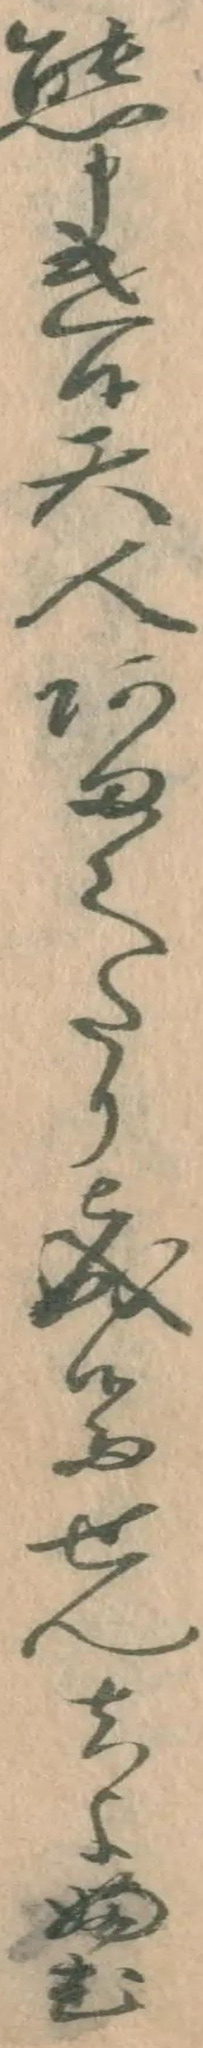態申遣候天人あまくたり被成候而せんちよふむ
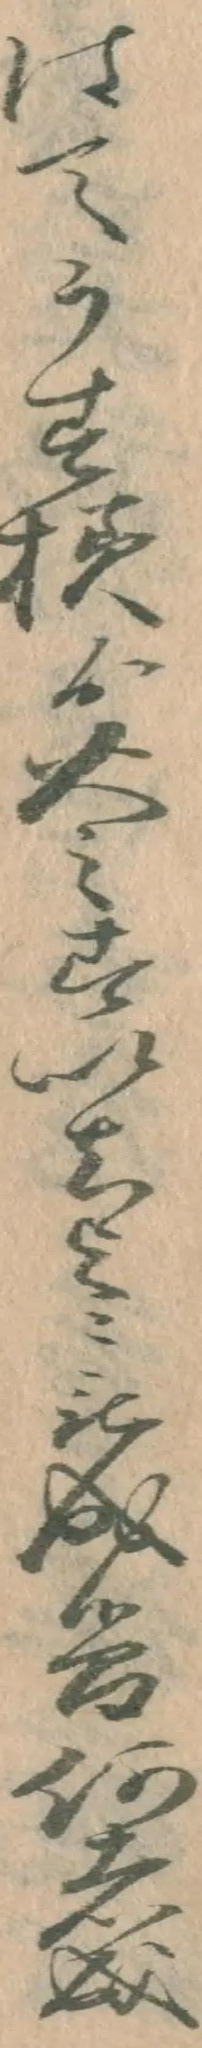はてうす様ゟ火之すいちよに被成候間何者成
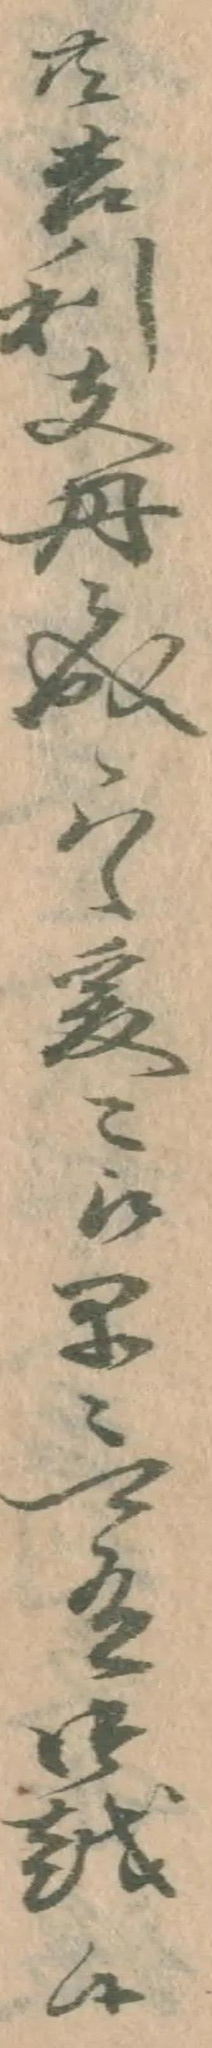共吉利支丹に成候はゝ爰々え早々可有御越候
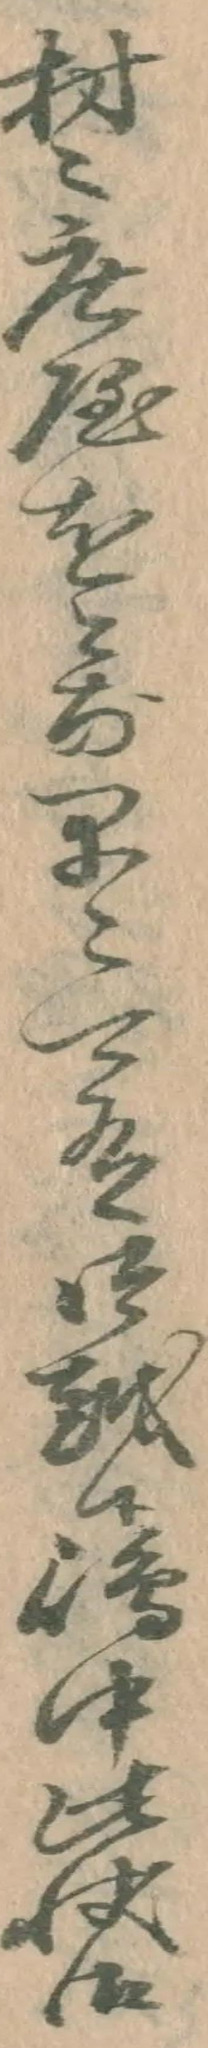村々庄屋をとな早々可有御越候島中此状御
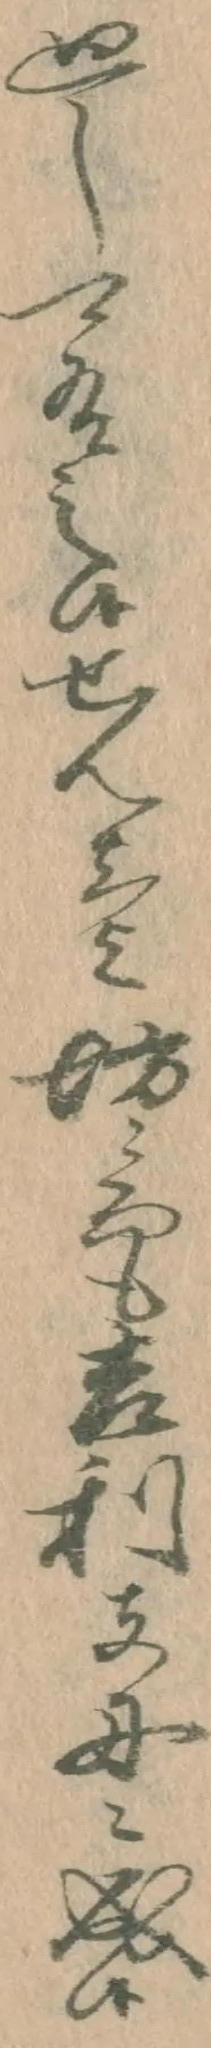廻し可有之候せんちよ坊に而も吉利支丹に成候
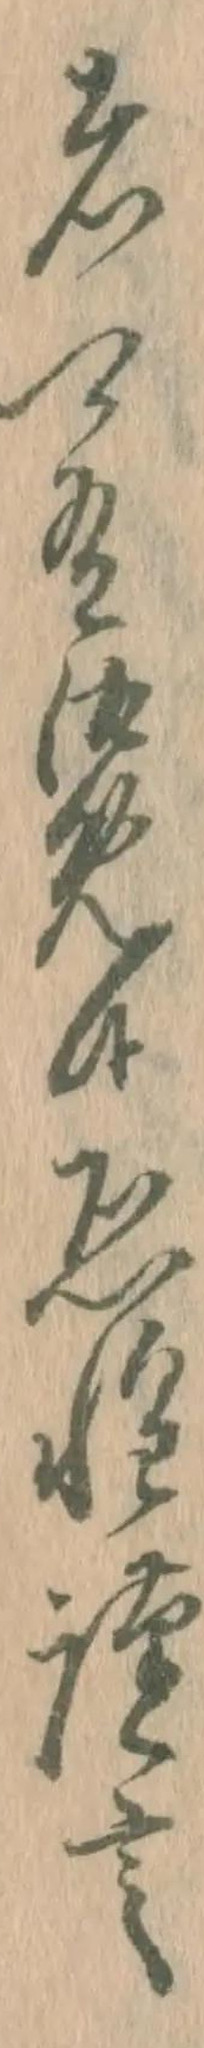者可有御免候恐惶謹言
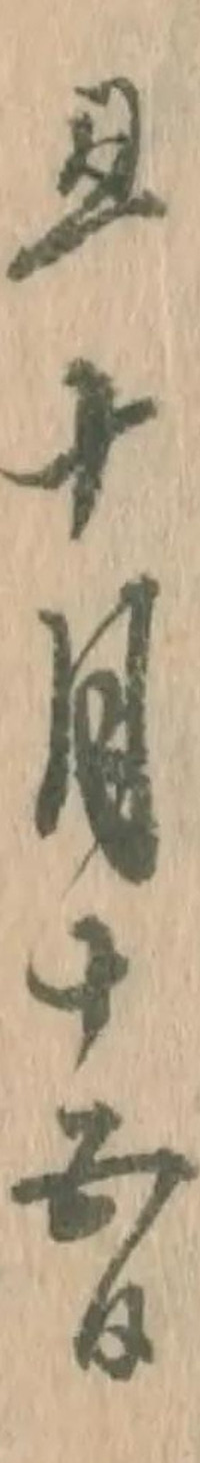丑十月十五日
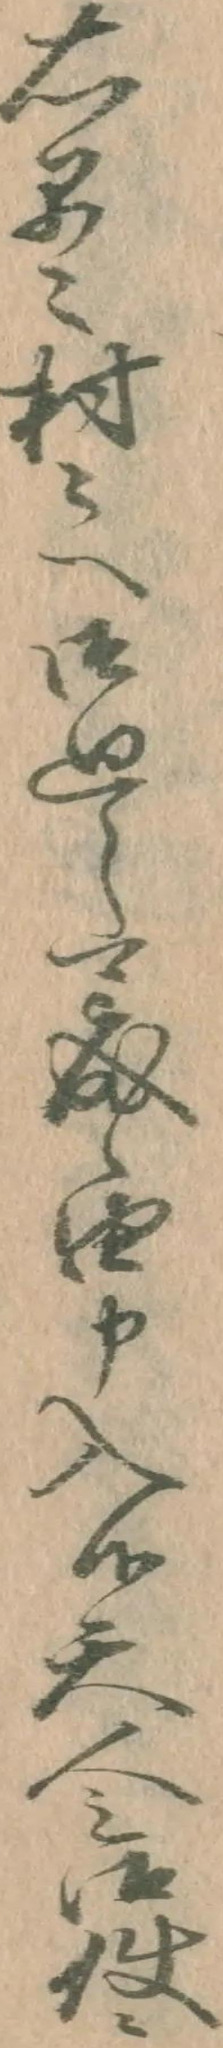右早々村々へ御廻し可被成候由申入候天人之御使に
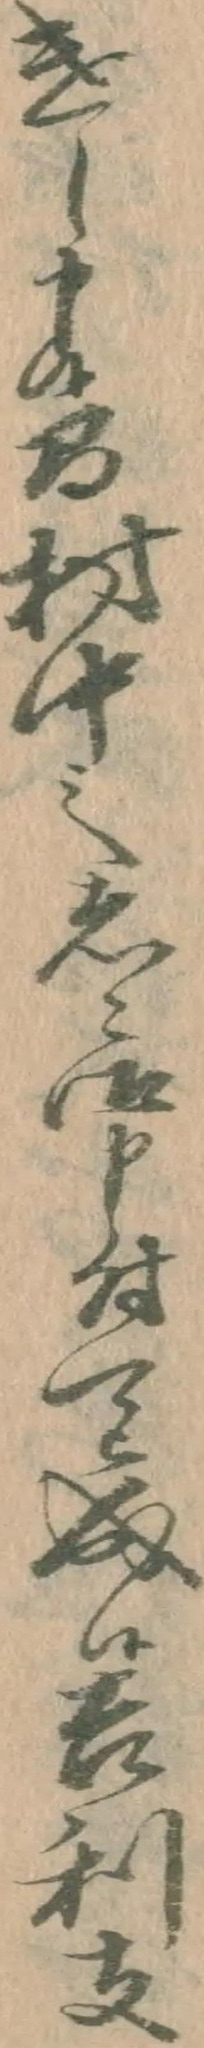遣し申候間村中之者に御申付可被成候吉利支
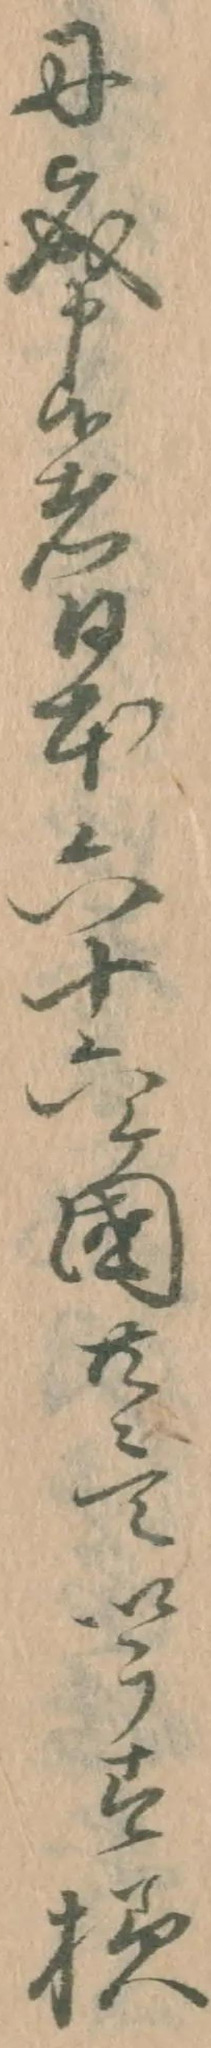丹被成申候者日本六十六ヶ国共にていうす様
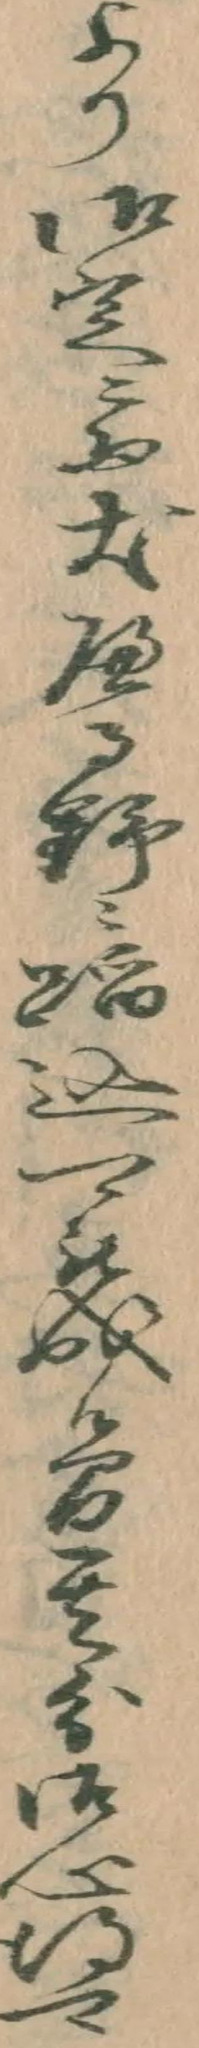より御定に而犬へるのに踏込可被成候間其分御心得可
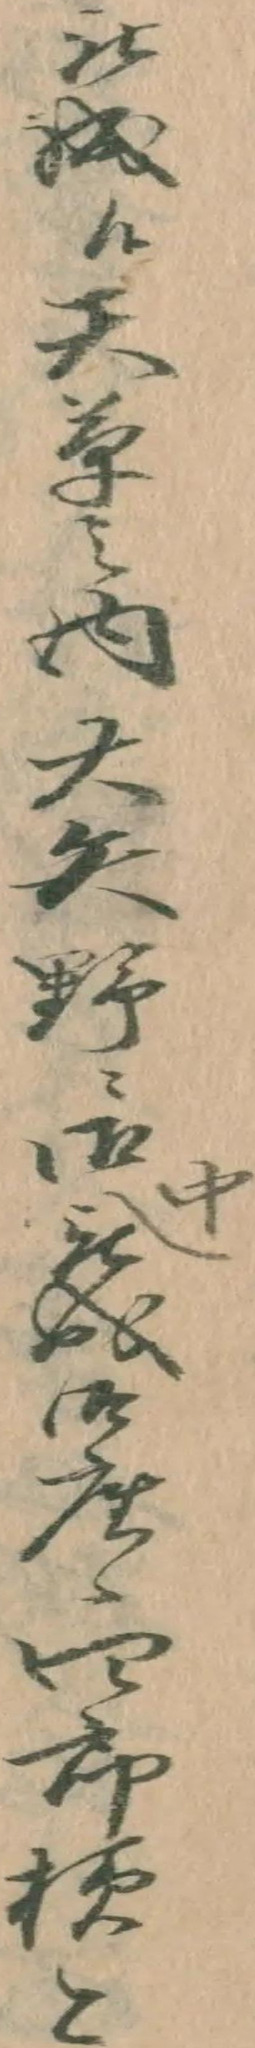被成候天草之内大矢野に御中被成御座候四郎様と
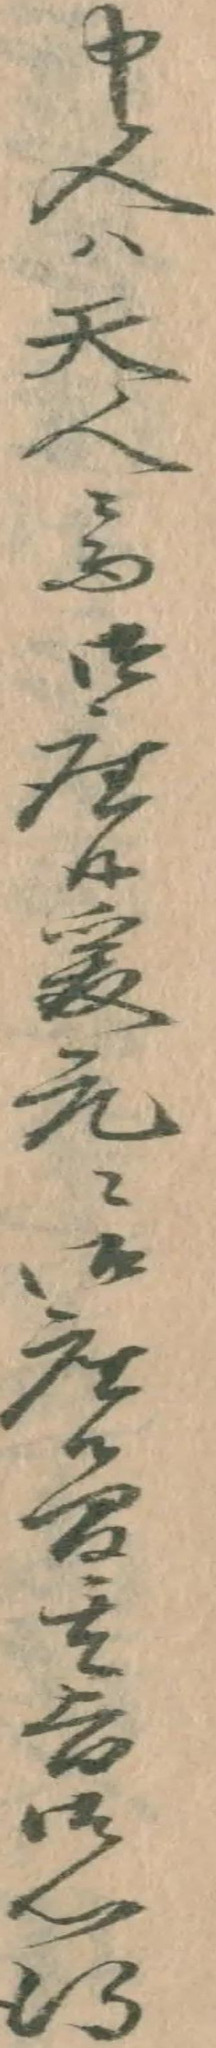申人は天人に而御座候爰元に御座候間其旨御心得
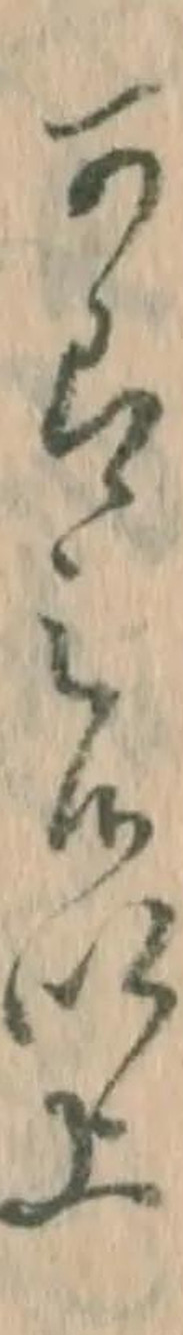可有之候以上
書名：切支丹御退治記 49巻. [1]
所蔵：国立国会図書館 National Diet Library, JAPAN
